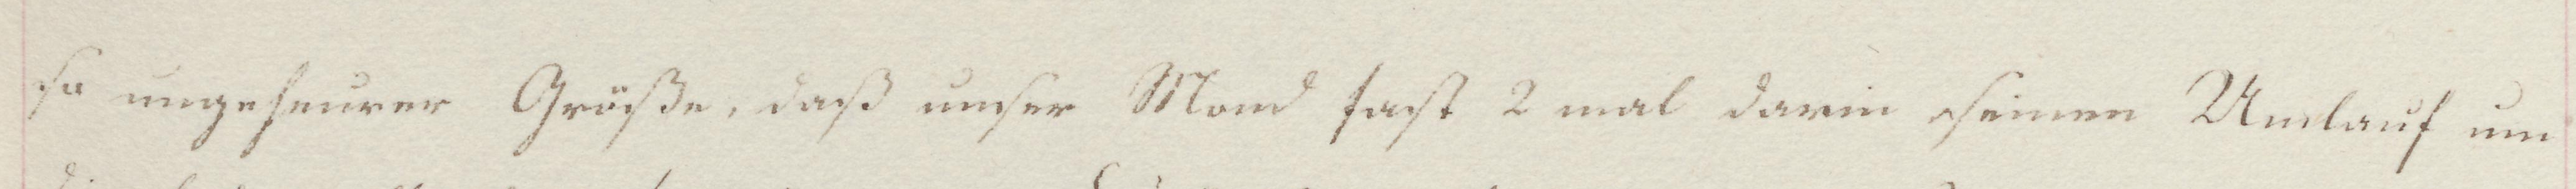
so ungeheurer Größe, daß unser Mond fast 2 mal darin seinen Umlauf um
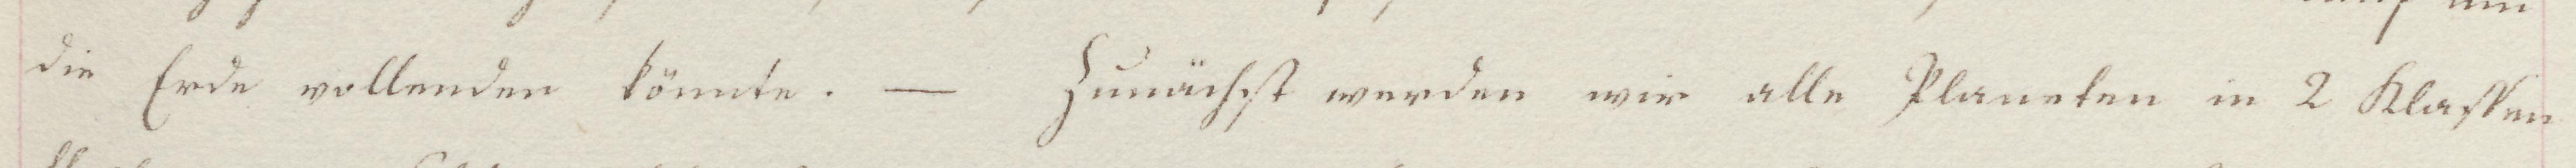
die Erde vollenden könnte. – Zunächst werden wir alle Planeten in 2 Klassen
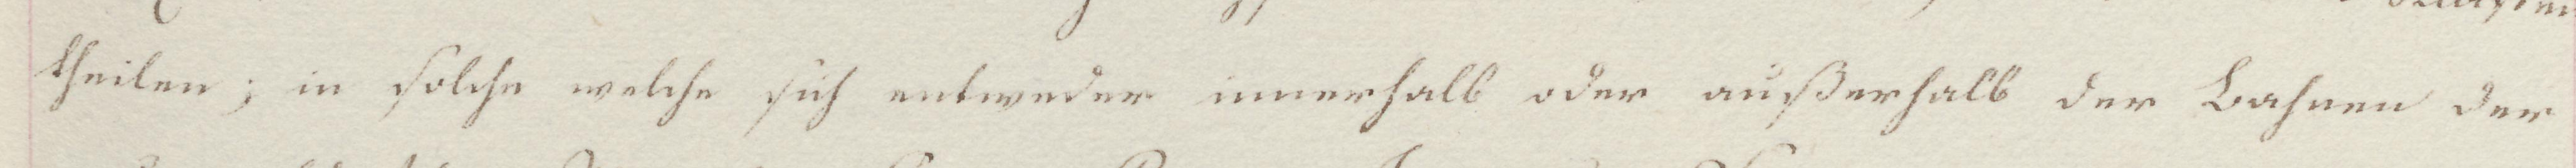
theilen; in solche welche sich entweder innerhalb oder außerhalb der Bahnen der
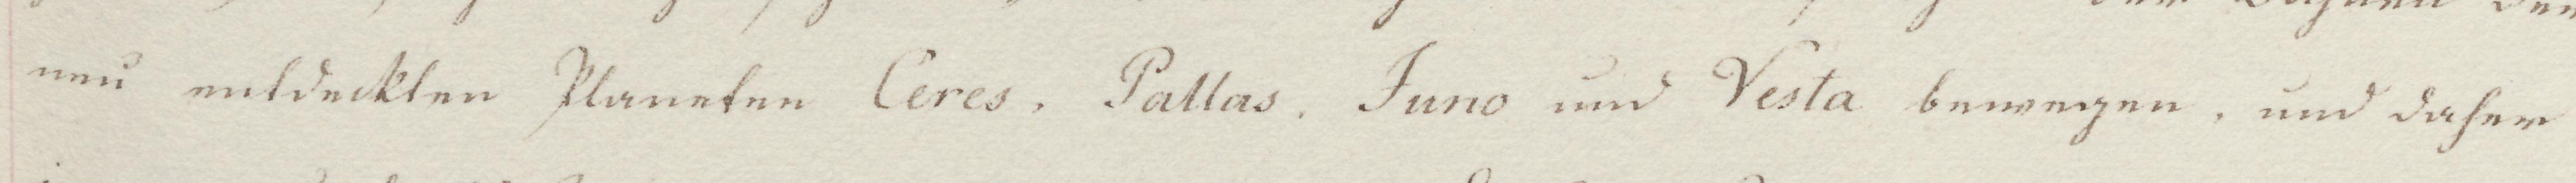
neu entdeckten Planeten Ceres, Pallas, Juno und Vesta bewegen, und daher
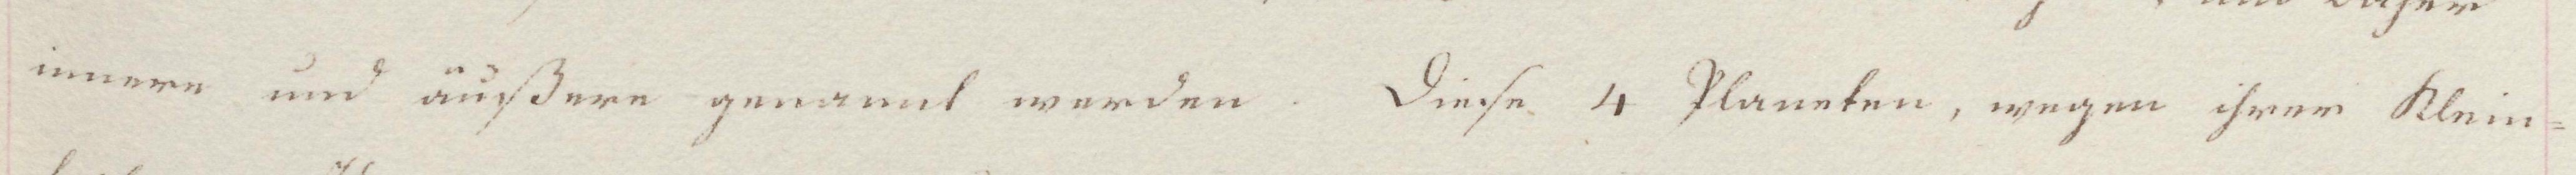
innere und äußere genannt werden. Diese 4 Planeten, wegen ihrer Klein-
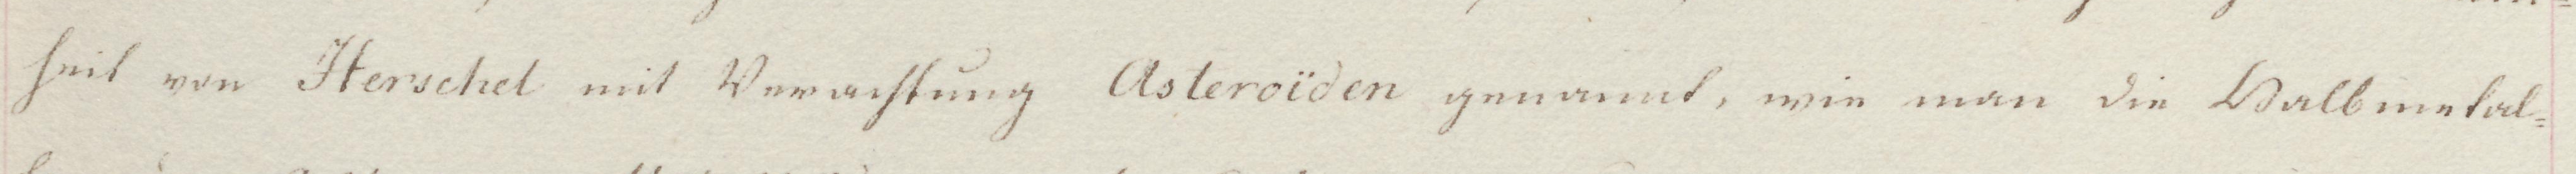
heit von Herschel mit Verachtung Asteroïden genannt, wie man die Halbmetal-
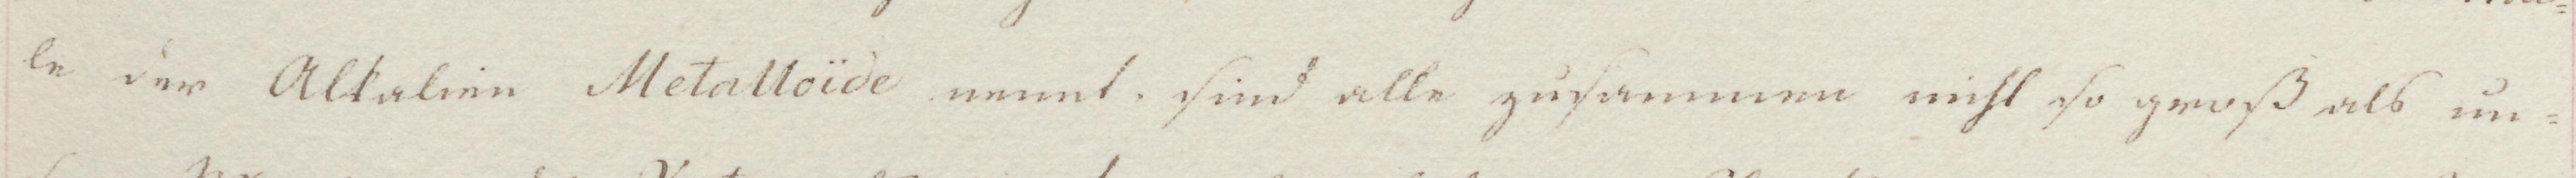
le der Alkalien Metalloïde nennt, sind alle zusammen nicht so groß als un-
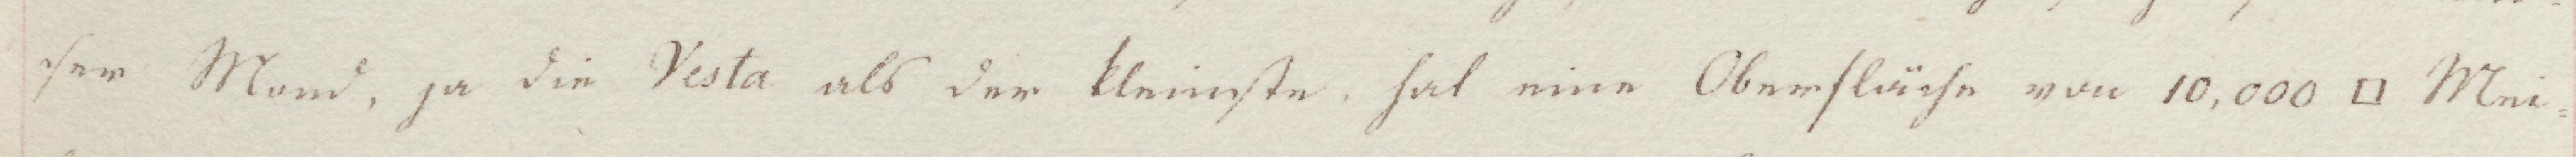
ser Mond, ja die Vesta als der kleinste, hat eine Oberfläche von 10,000 □ Mei-
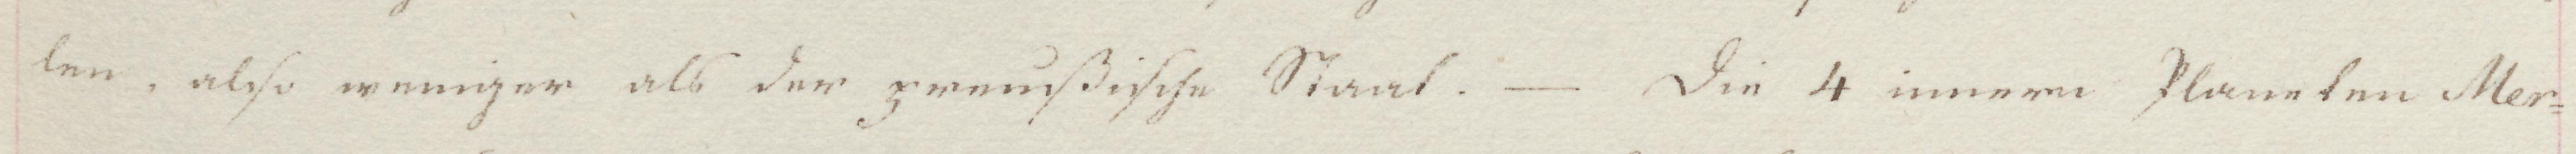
len, also weniger als der preußische Staat. – Die 4 innern Planeten Mer-
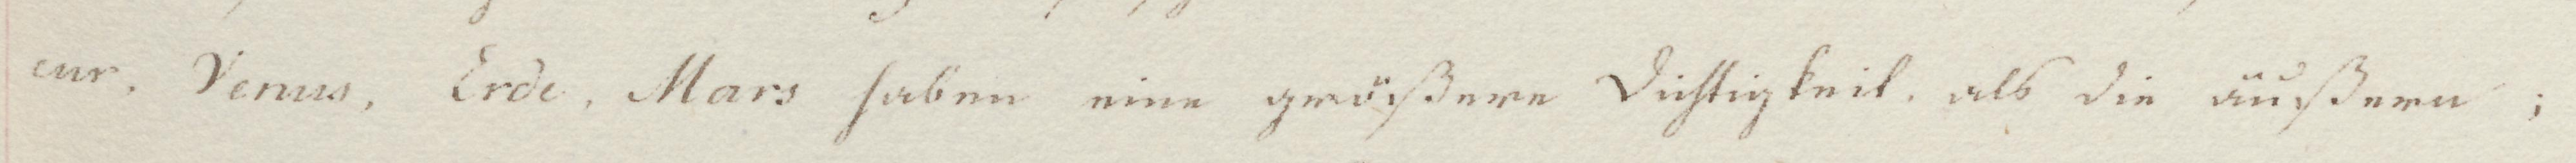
cur, Venus, Erde, Mars haben eine größere Dichtigkeit als die äußern;
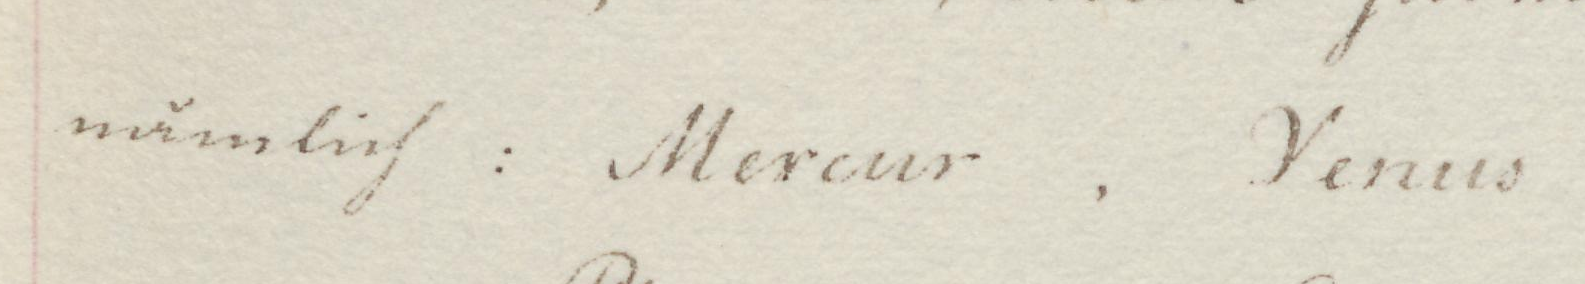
nämlich: Mercur, Venus,
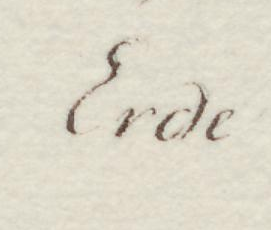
Erde,
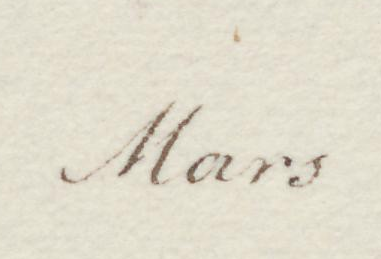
Mars;
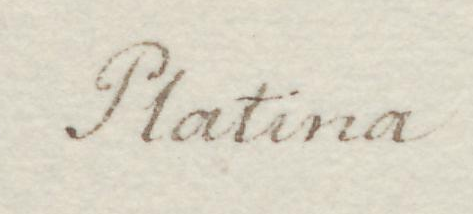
Platina
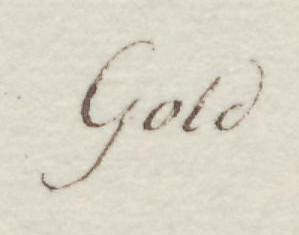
Gold
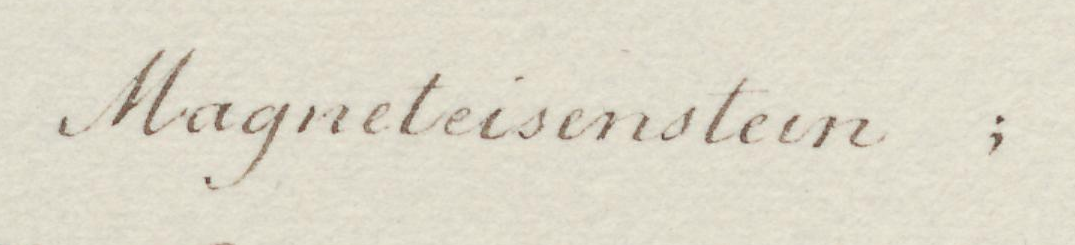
Magneteisenstein;
